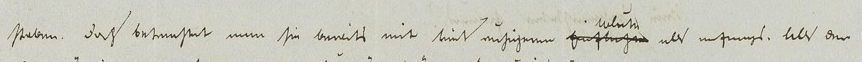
streben. Doch betrachtet man sie bereits mit weit ruhigerem EinflußeBlute als anfangs. Als der
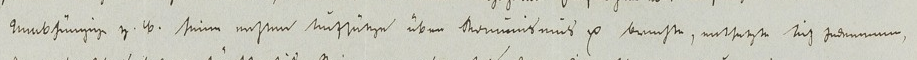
Unabhängige z. B. seine ersten Aufsätze über Kommunismus & brachte, entsetzte sich Jedermann,
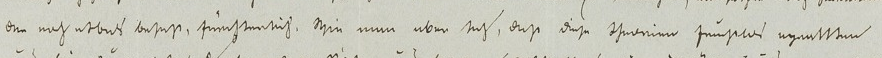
der noch etwas besaß, fürchterlich. Wie man aber sah, daß diese Theorien fruchtlos ...prallten
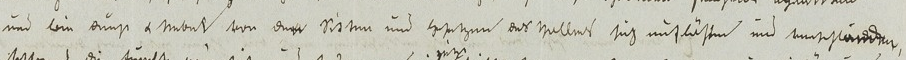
und wie Dunst & Nebel von den Sitten und Gesetzen des Volkes sich auflösten und verschwanden,
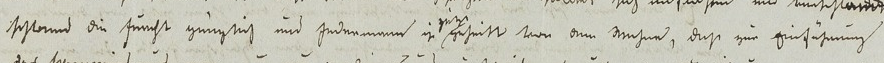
schwand die Furcht gänzlich und Jedermann ist jetzt geheilt von dem Wahne, daß zur Einführung
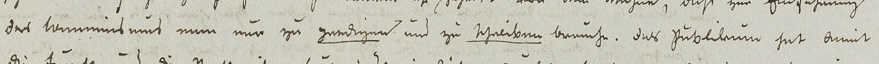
des Kommunismus man nur zu predigen und zu schreiben brauche. Das Publikum hat damit
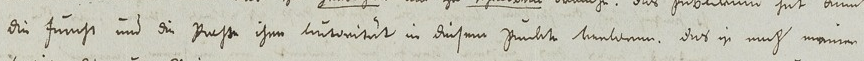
die Furcht und die Preße ihre Autorität in diesem Punkte verloren. Das ist nach meiner
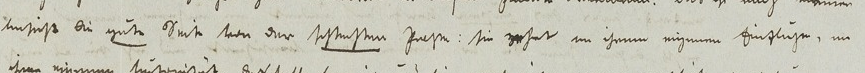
Ansicht die gute Seite von der schlechten Preße: sie zehrt an ihrem eigenen Einfluße, an
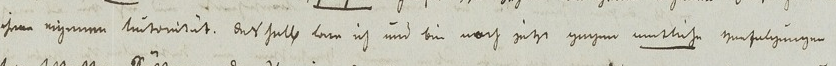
ihrer eigenen Autorität. Deshalb war ich und ich noch jetzt gegen amtliche Verfolgungen
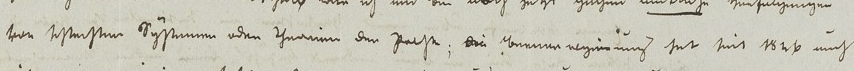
von schlechten Systemen oder Theorien der Preße; die Bernerregierung hat seit 1846 auch
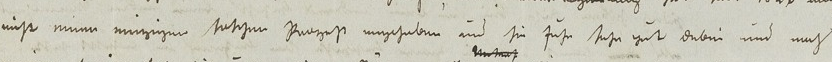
nicht einen einzigen solchen Prozeß angehoben und sie fuhr sehr gut dabei und nach
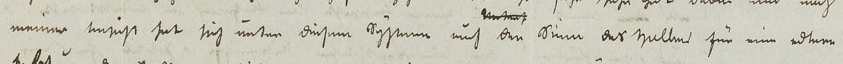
meiner Ansicht hat sich unter diesem Systeme auch ... der Sinn des Volkes für eine edlere
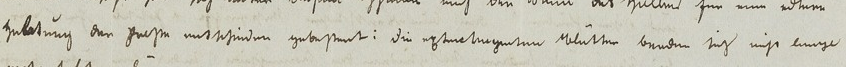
Haltung der Preße entschieden gebeßert: die extravaganten Blätter werden sich nicht lange
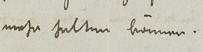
mehr halten können.
